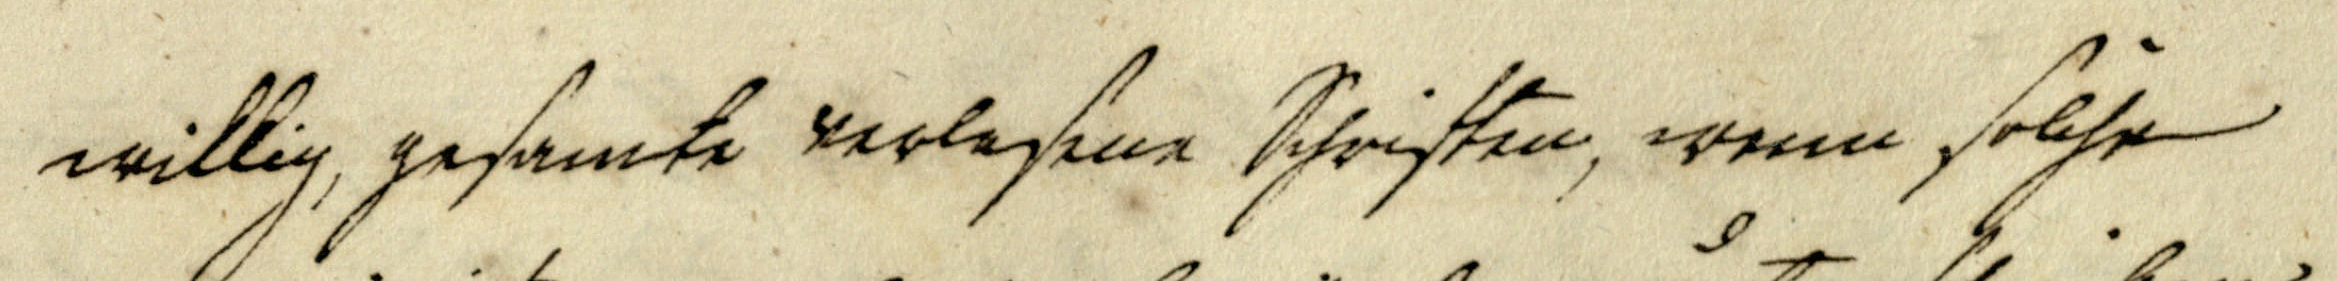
willig, gesamte verlesene Schriften, wenn solche
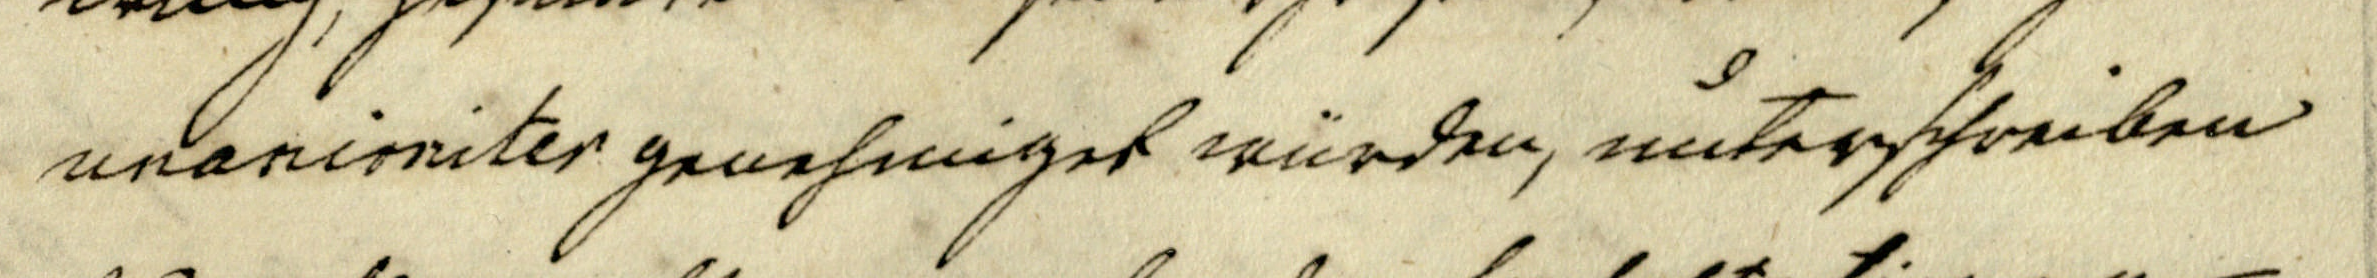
unanimiter genehmiget würden, unterschreiben
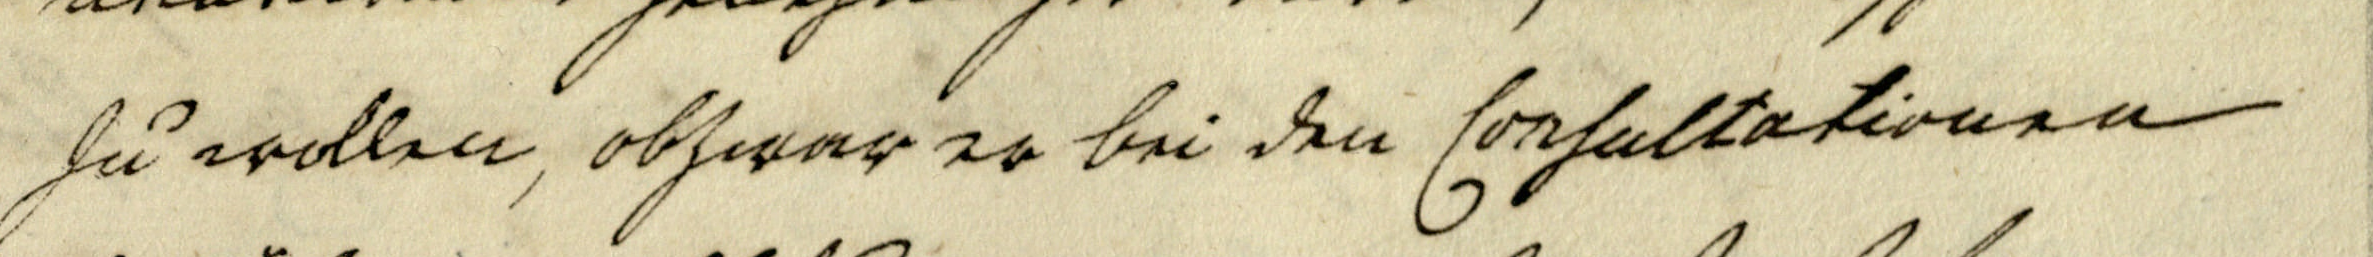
zu wollen, obzwar er bei den Consultationen
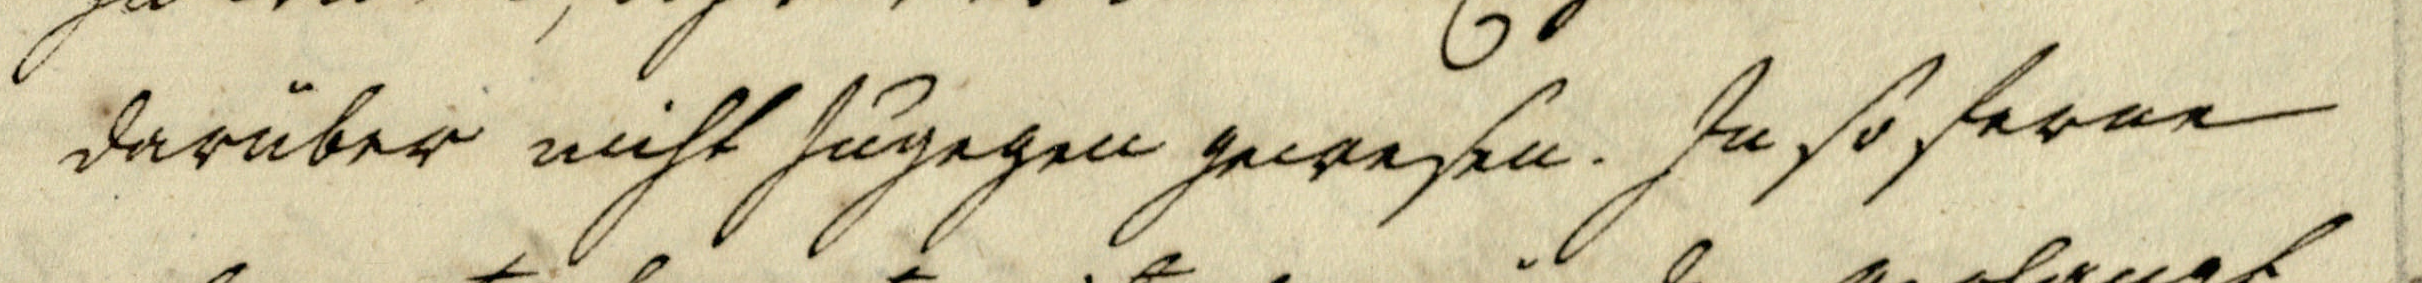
darüber nicht zugegen gewesen. In so ferne
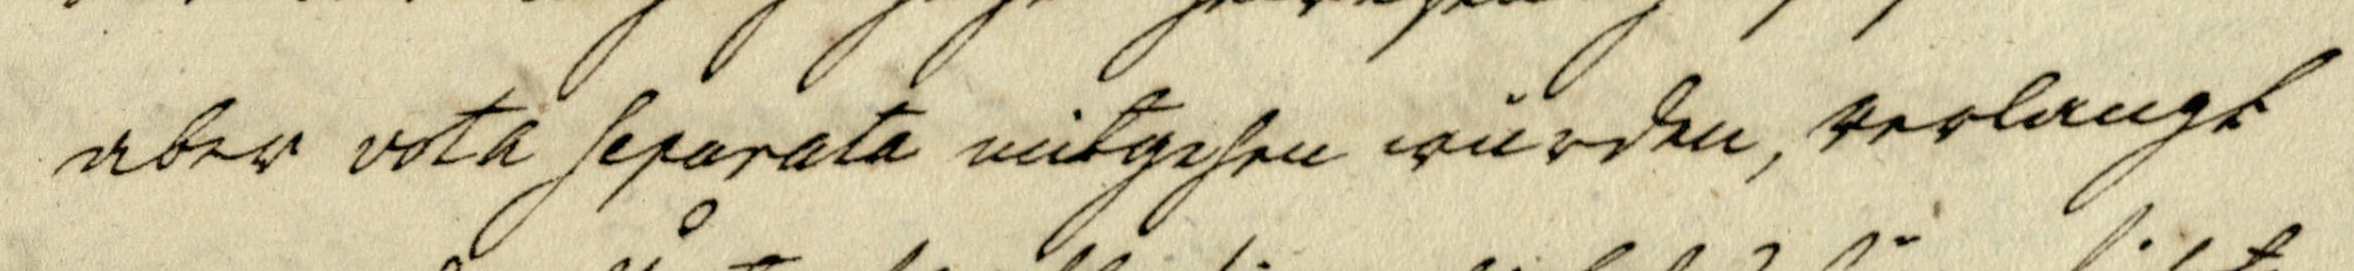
aber vota separata mitgehen würden, verlangt
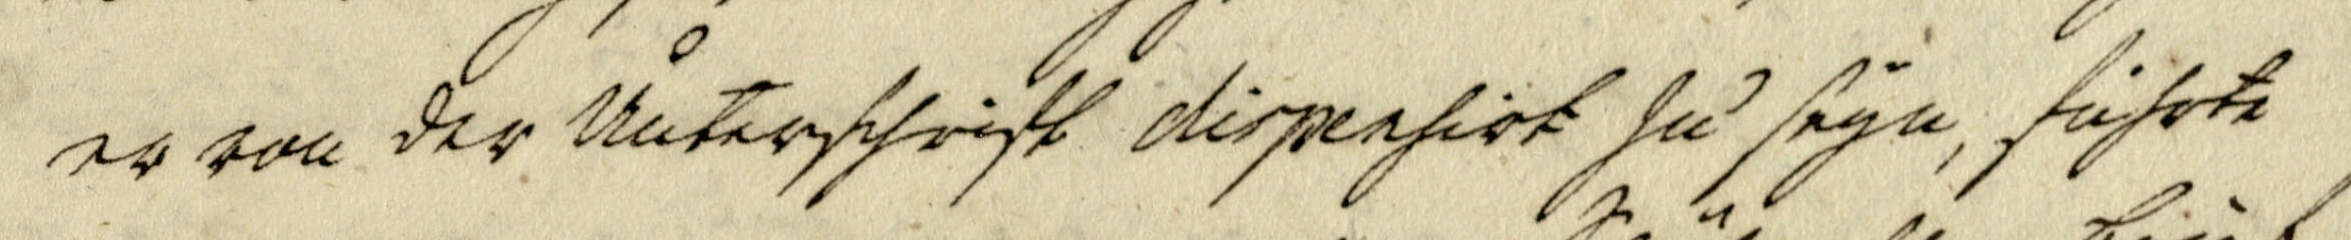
er von der Unterschrift dispensirt zu seÿn, führte
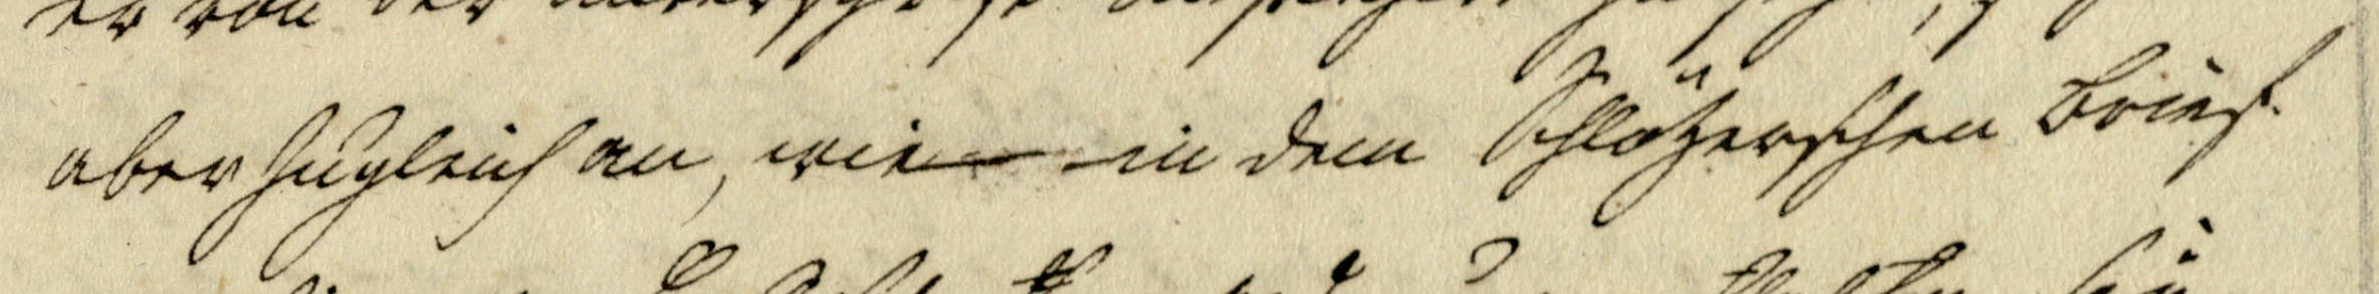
aber zugleich an, wie in dem Schlözerschen Brief¬
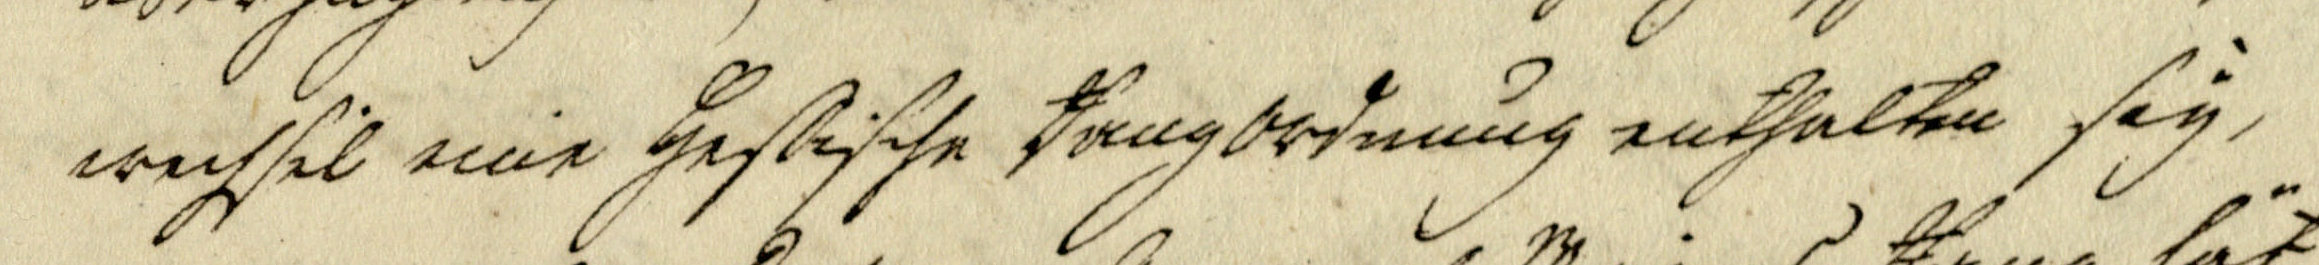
wechsel eine Hessische Rangordnung enthalten seÿ,
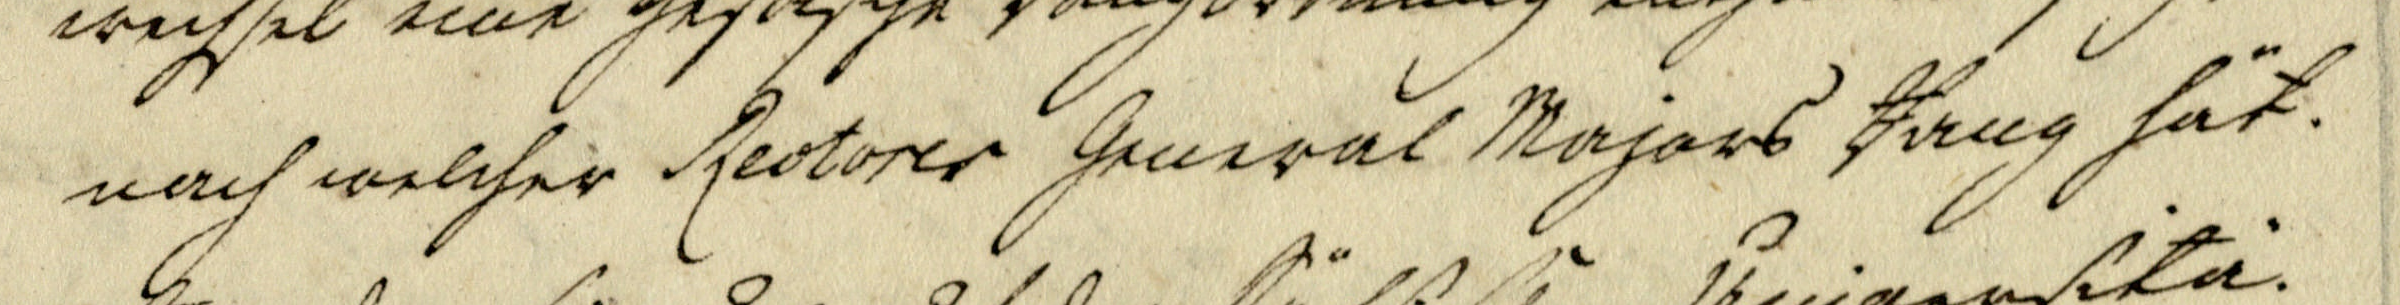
nach welcher Rectores General Majors Rang hät¬
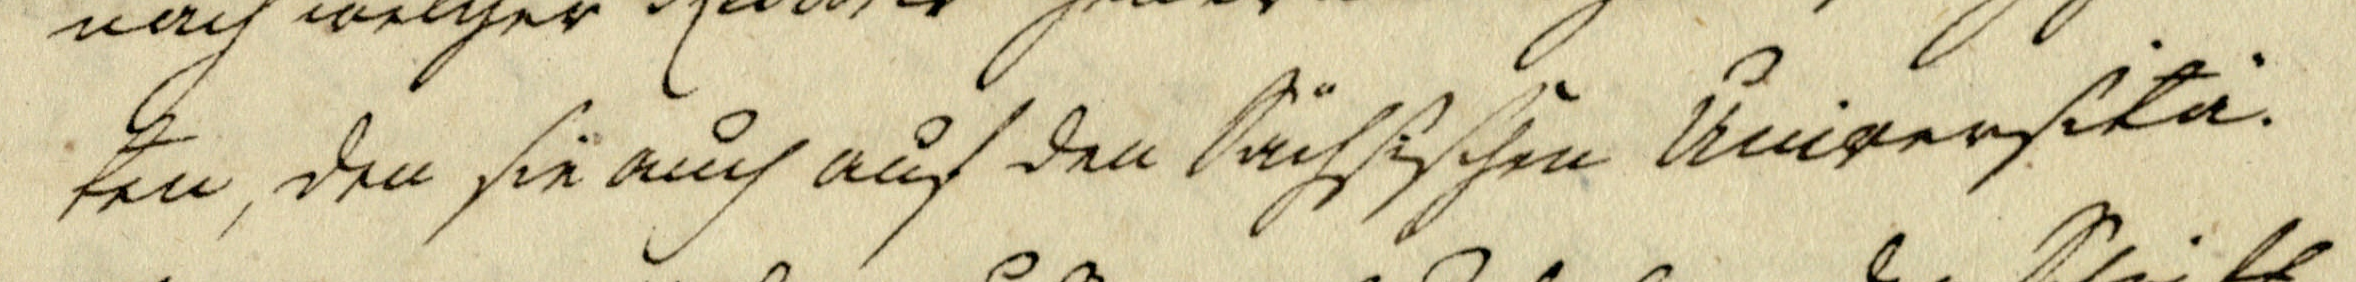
ten, den sie auch auf den Sächsischen Universitä¬
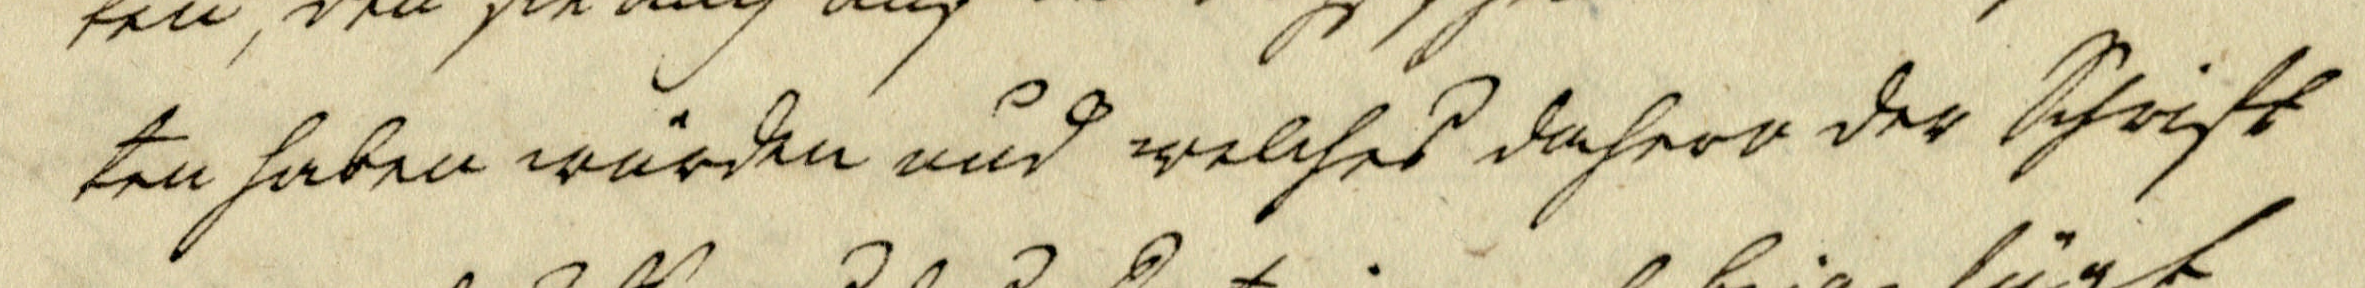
ten haben würden und welches dahero der Schrift
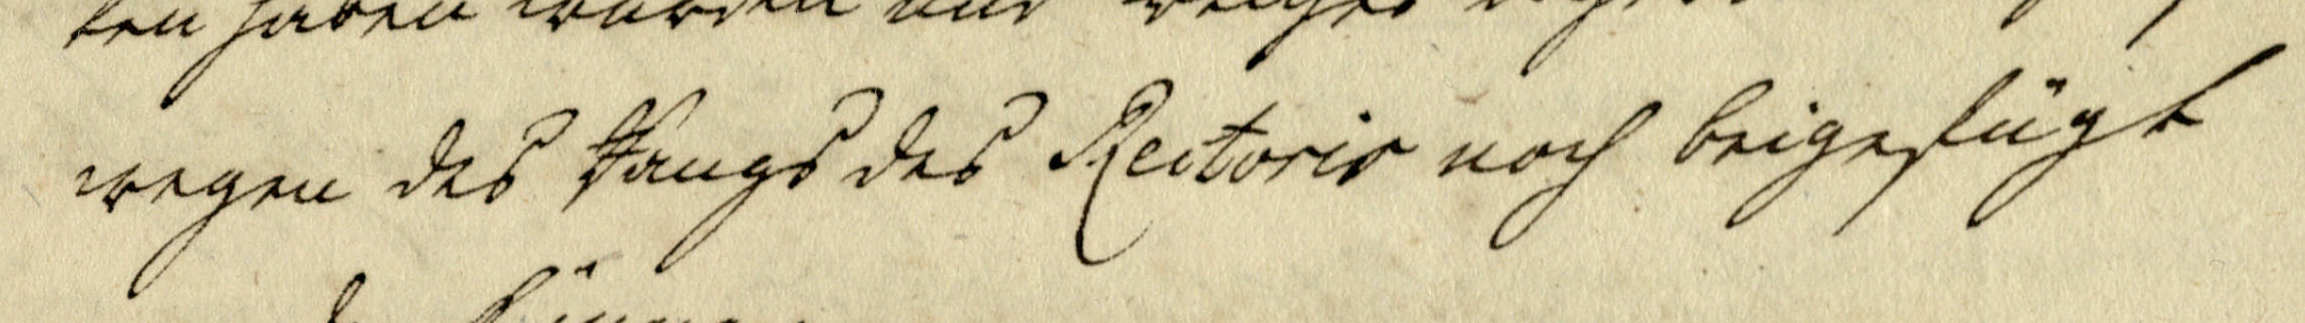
wegen des Rangs des Rectoris noch beigefügt
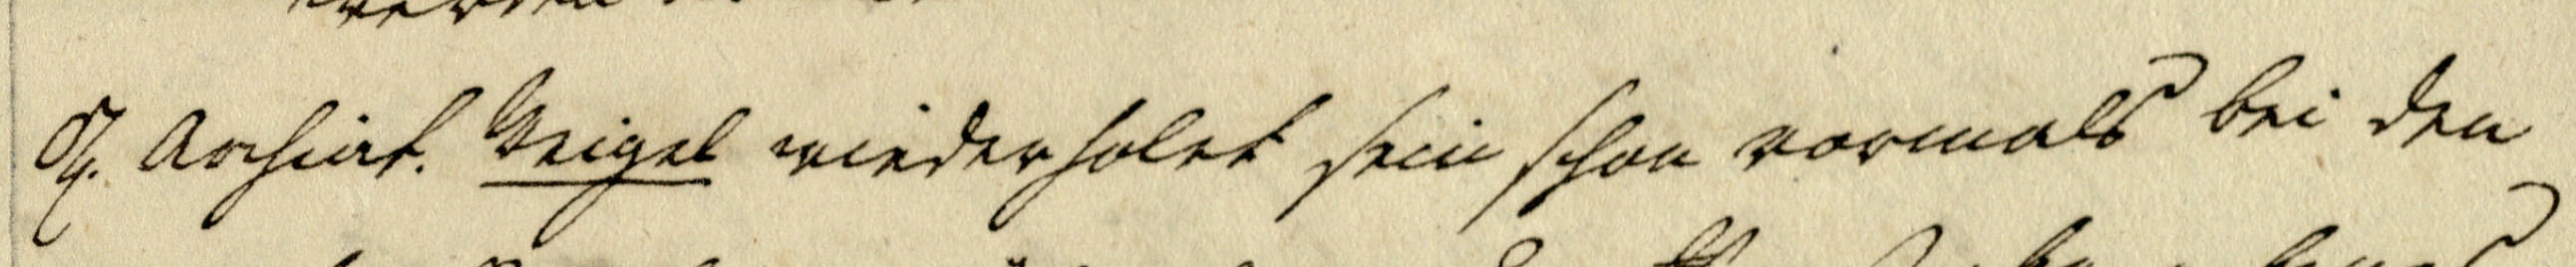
dh. Archiat. Weigel wiederholet sein schon vormals bei den
